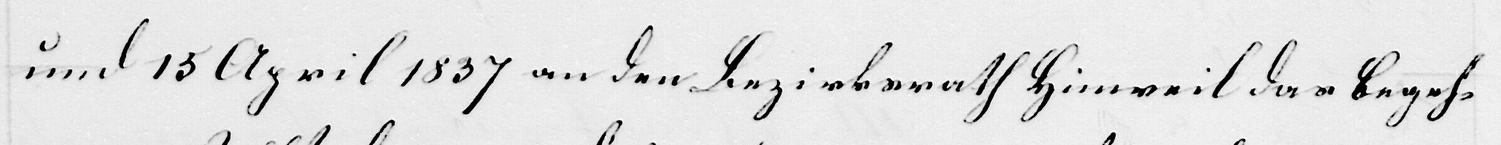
und 15 April 1837 an den Bezirksrath Hinweil das Begeh¬
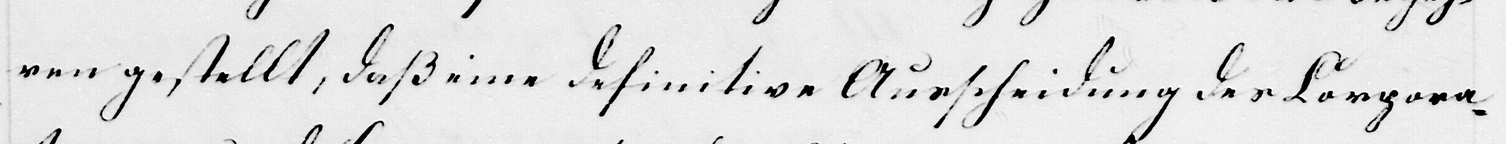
ren gestellt, daß eine definitive Ausscheidung des Corpora¬
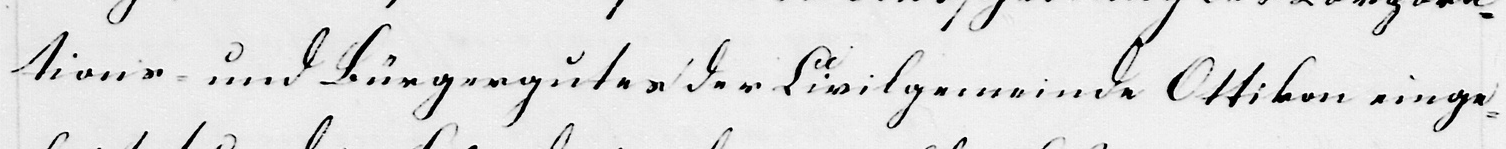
tions- und Bürgergutes der Civilgemeinde Ottikon einge¬
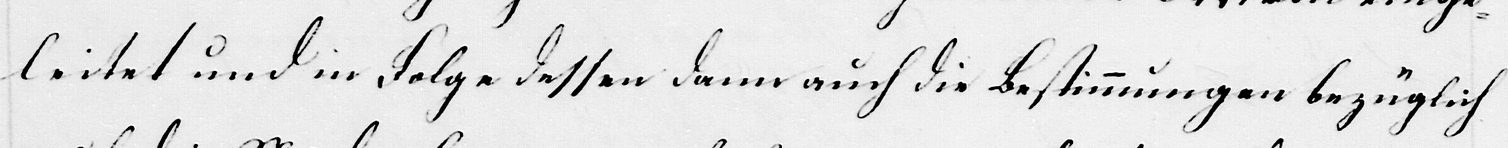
leitet und in Folge dessen dann auch die Bestimmungen bezüglich
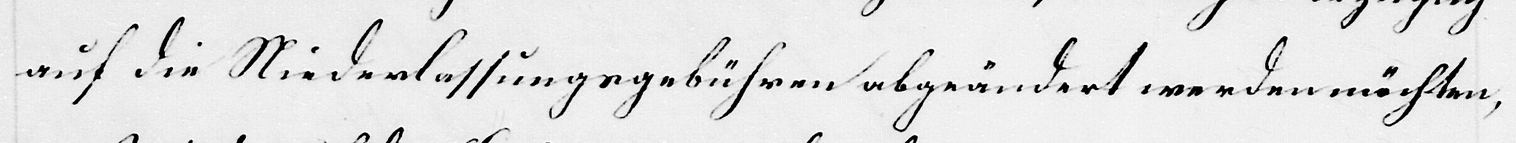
auf die Niederlaßungsgebühren abgeändert werden möchten,
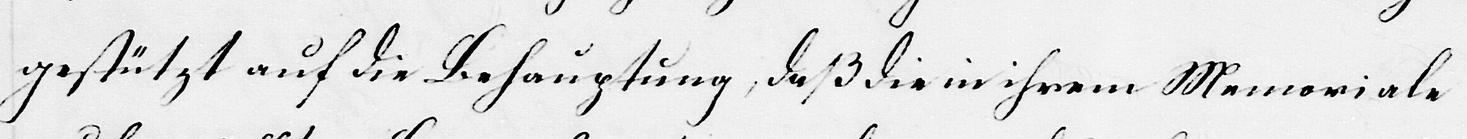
gestützt auf die Behauptung, daß die in ihrem Memoriale
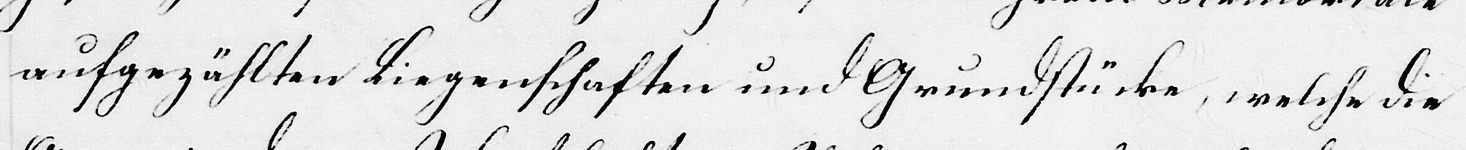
aufgezählten Liegenschaften und Grundstücke, welche die
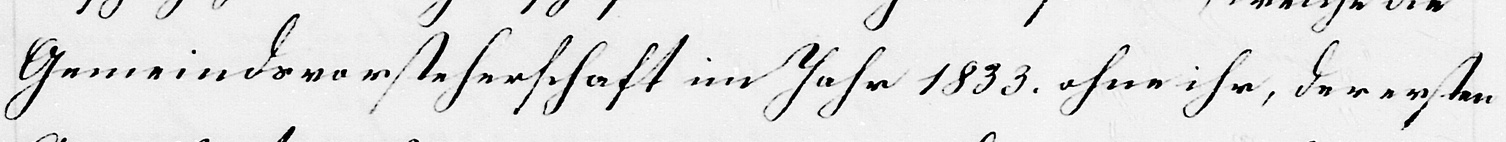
Gemeindsvorsteherschaft im Jahr 1833. ohne ihr, der ersten
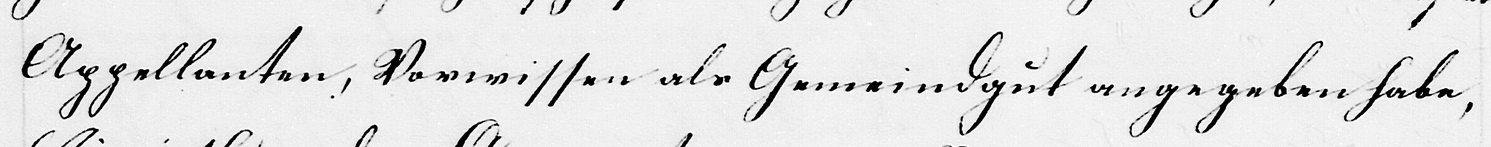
Appellanten, Vorwissen als Gemeindgut angegeben habe,
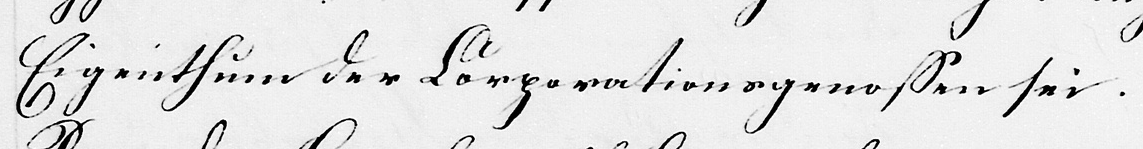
Eigenthum der Corporationsgenoßen sei.
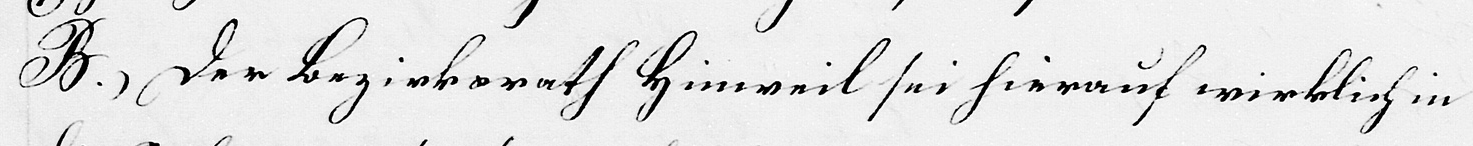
B., Der Bezirksrath Hinweil sei hierauf wirklich in
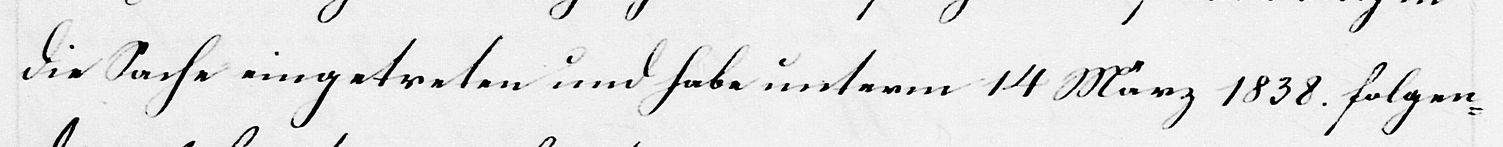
die Sache eingetreten und habe unterm 14 März 1838. folgen¬
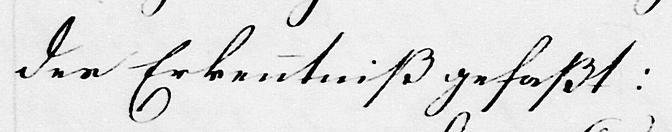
des Erkenntniß gefaßt:
